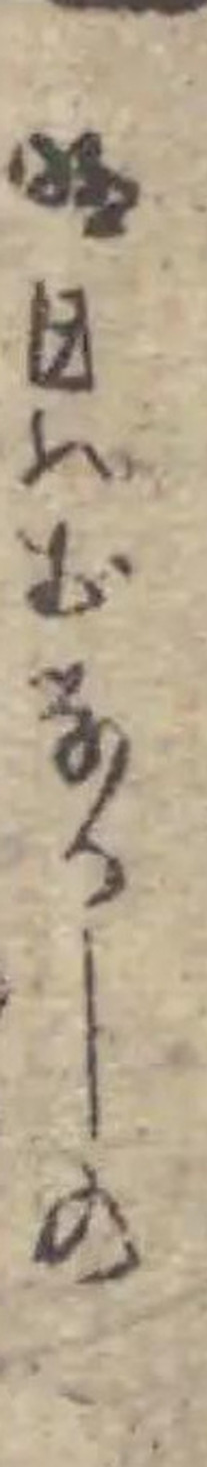明日はおなかしの
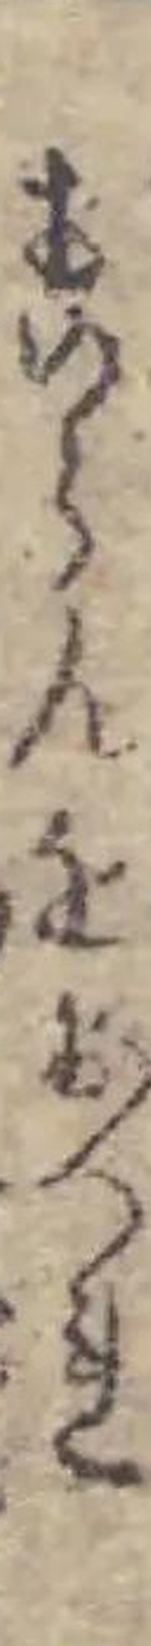おいらんをおつれ
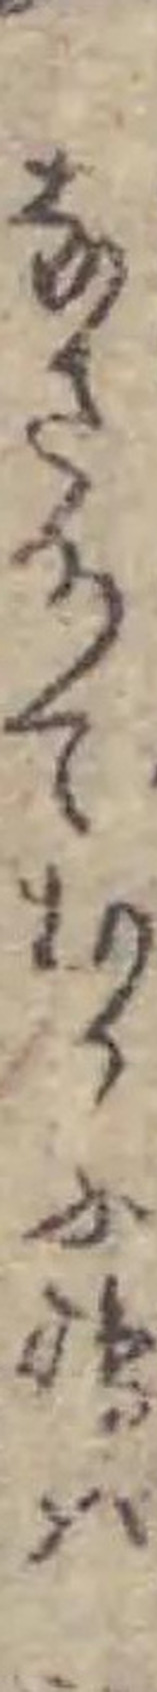なさつてむかふ嶋は
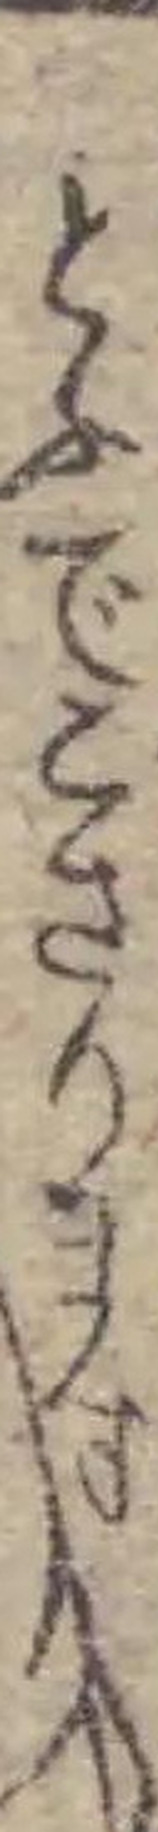とふでこさります
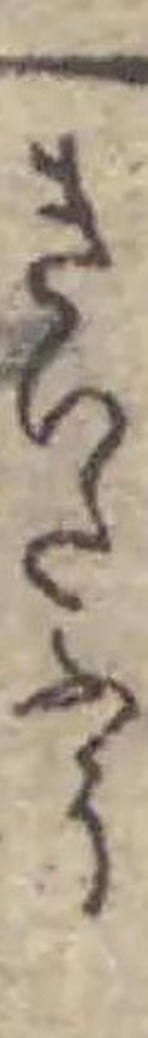きいたふう
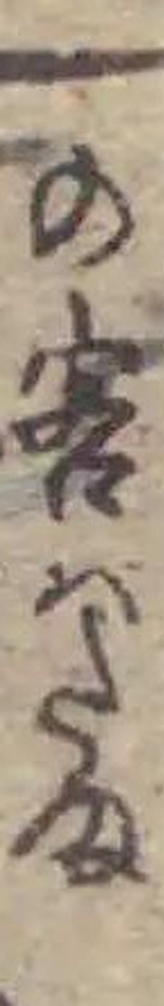の客はたま
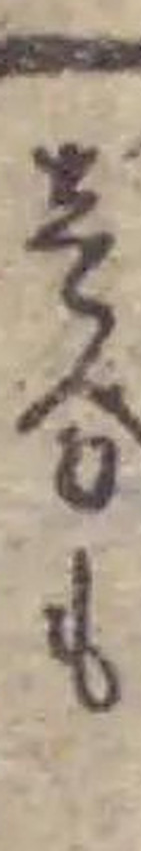壱分も
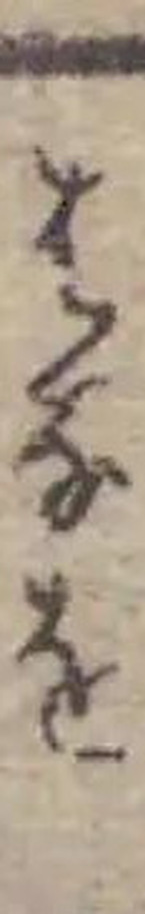はなを
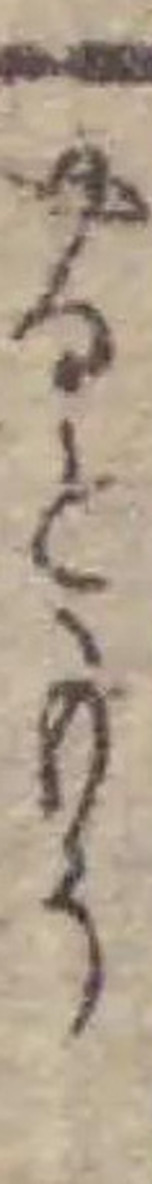やるともう
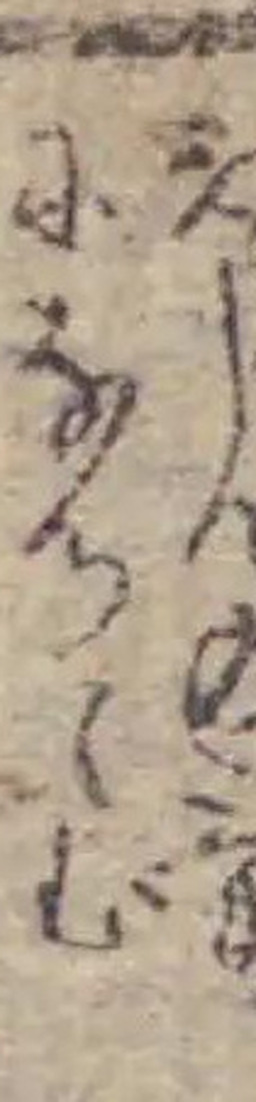になつてむ
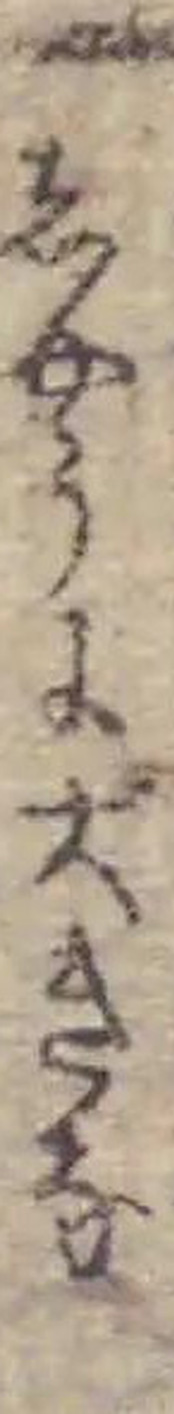しやうに大きな
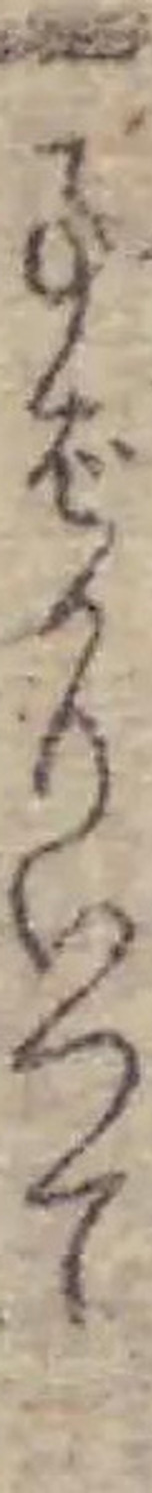事ばかりいつて
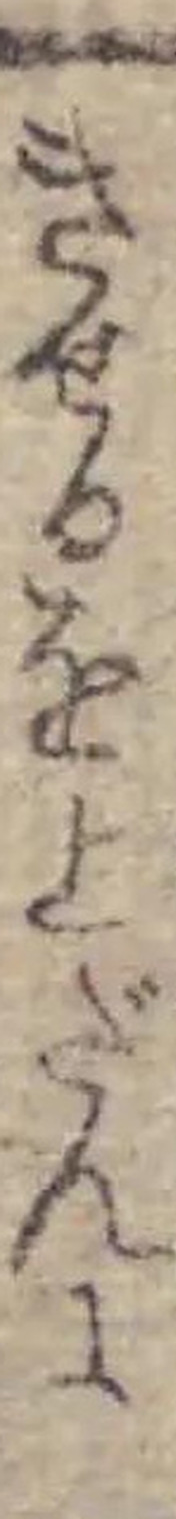きせるを上だんに
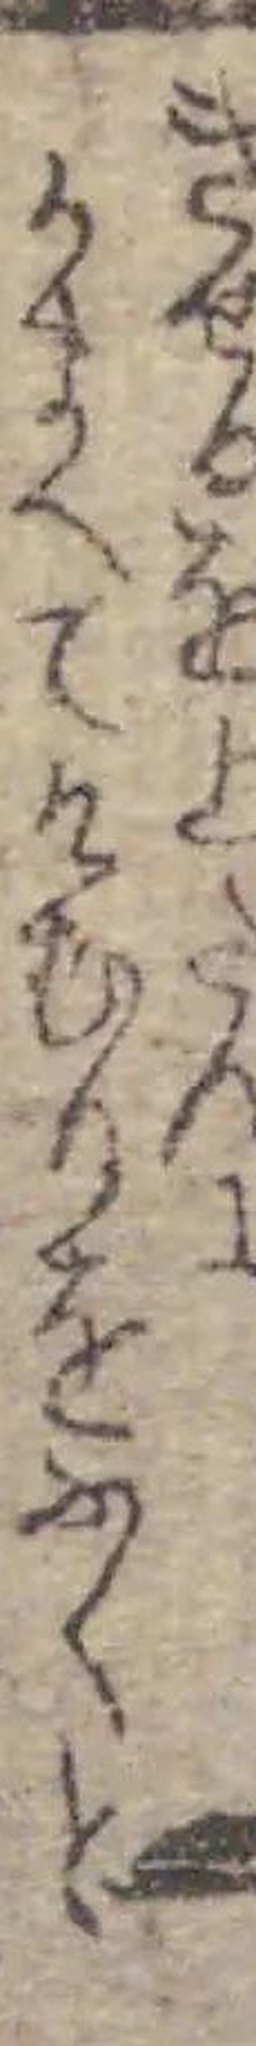かまへてけむりをふくと
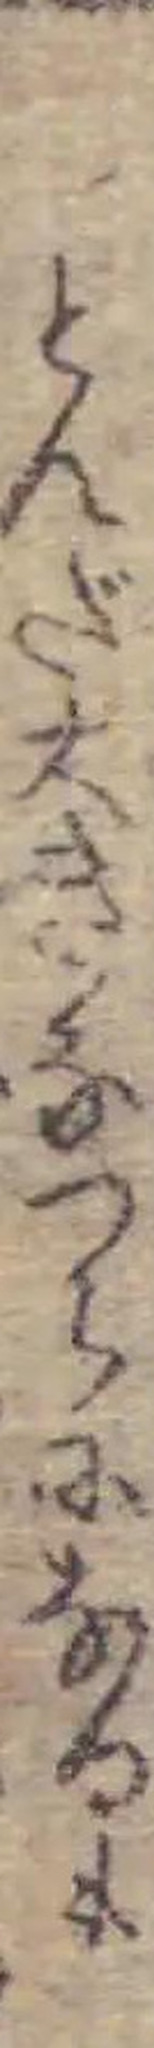とんだ大きなつらになるも
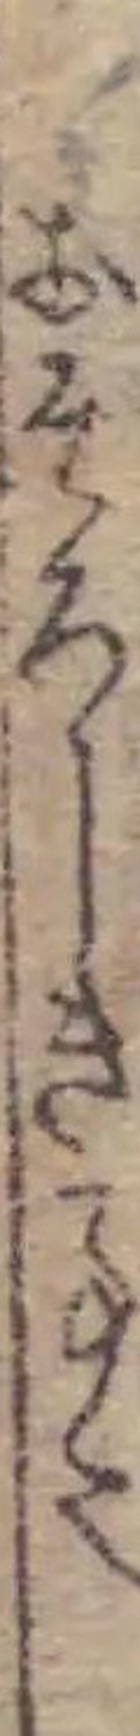おそろしき事也
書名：作意妖恐懼感心 2巻
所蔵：国立国会図書館 National Diet Library, JAPAN
